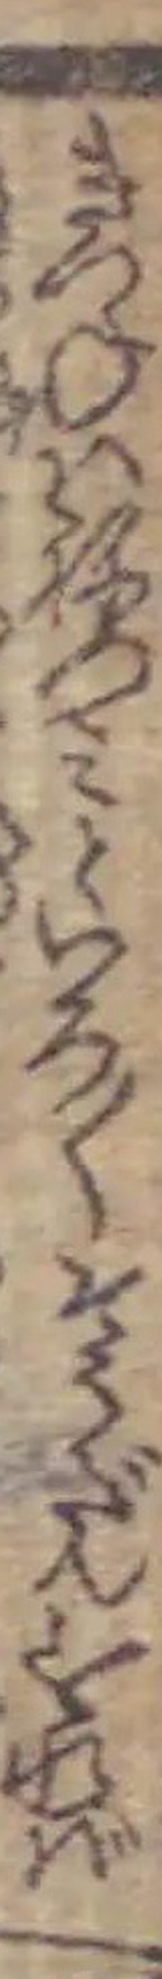きつねはねつみといろ〳〵そうだんをすれば
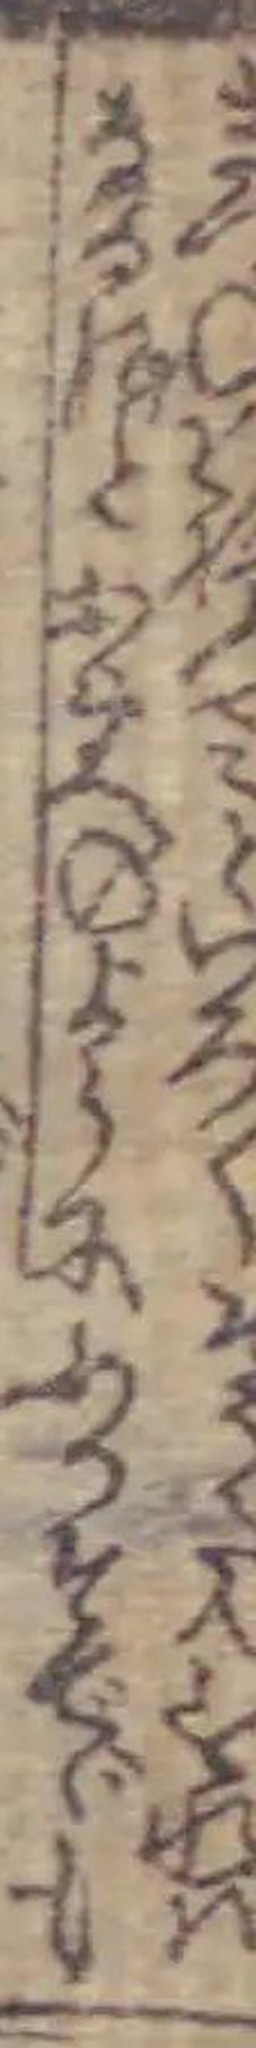なるほどおまへのようにふりそでゞも
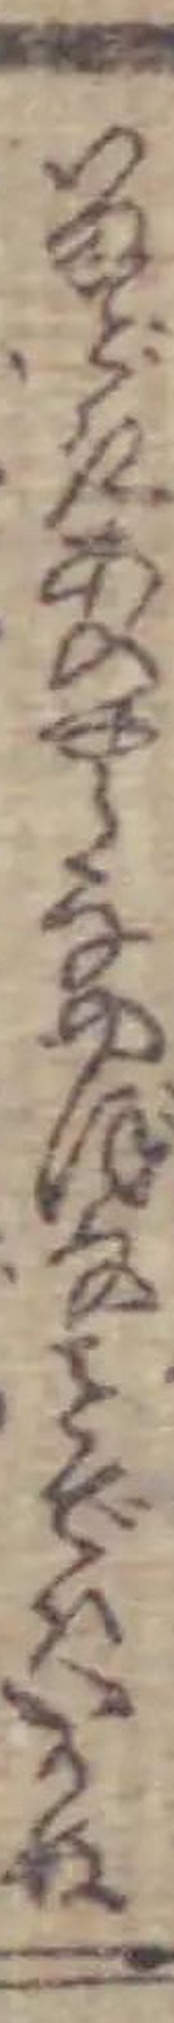いまどきあのやうなやぼなことではいかぬ
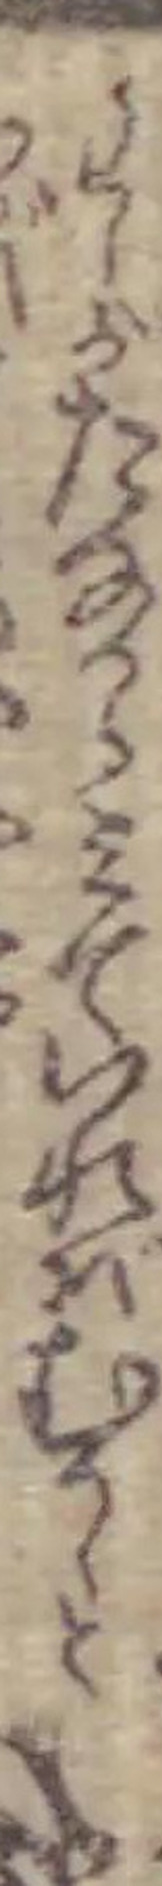わしがたなからみていればむかしと
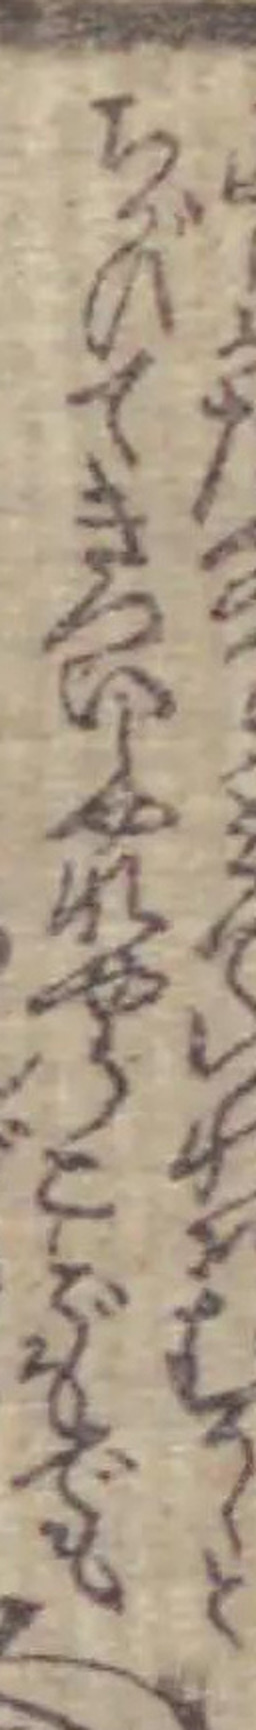ちがひてきついしやれやうこどもでも
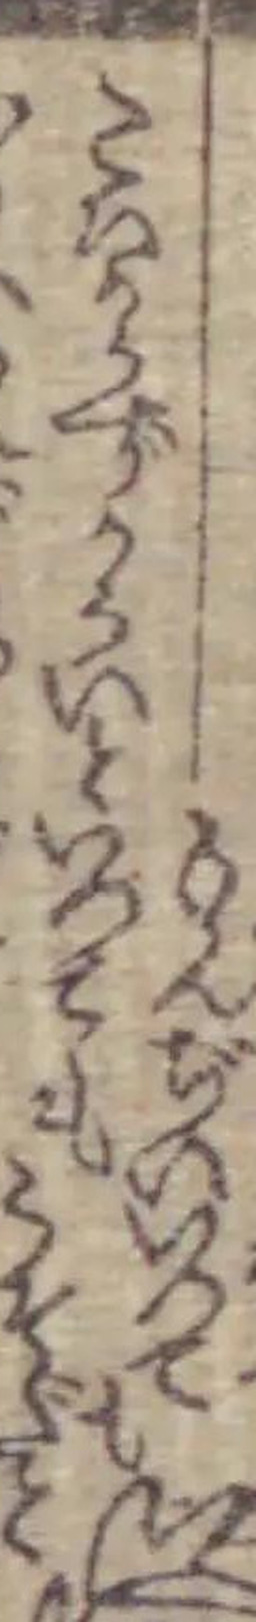こはからずからいといつてもうそだと
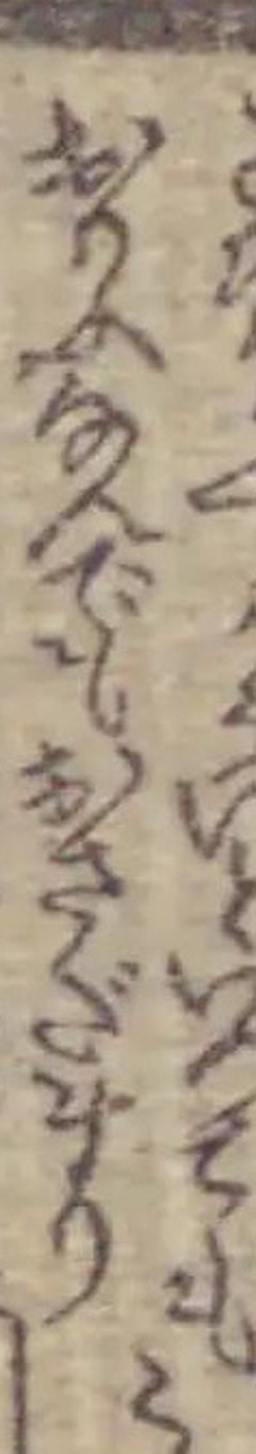おもふなんでもおさだまり
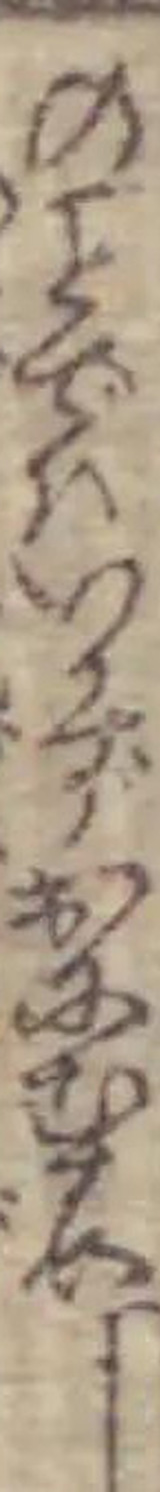のことではいかずおにむすめ
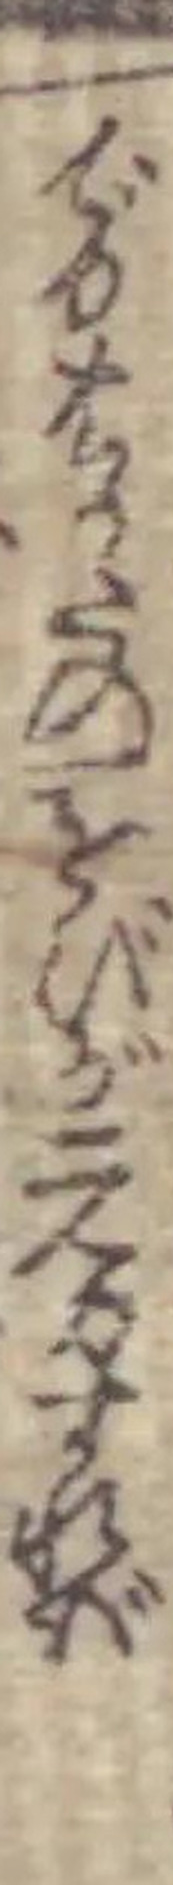でるはかたのをびが二分すれば
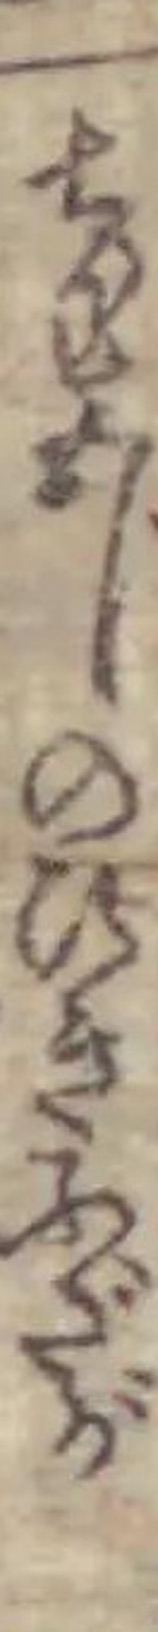七りわ五じのひきふだが
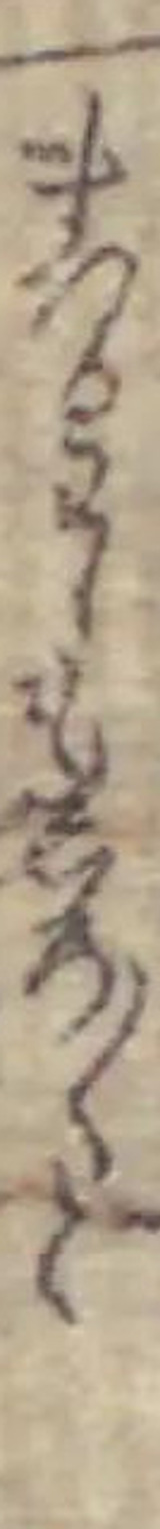まはるわしもしか〳〵と
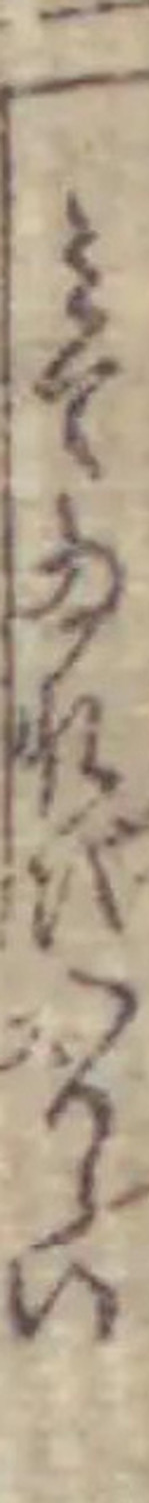みてゐればおかしい
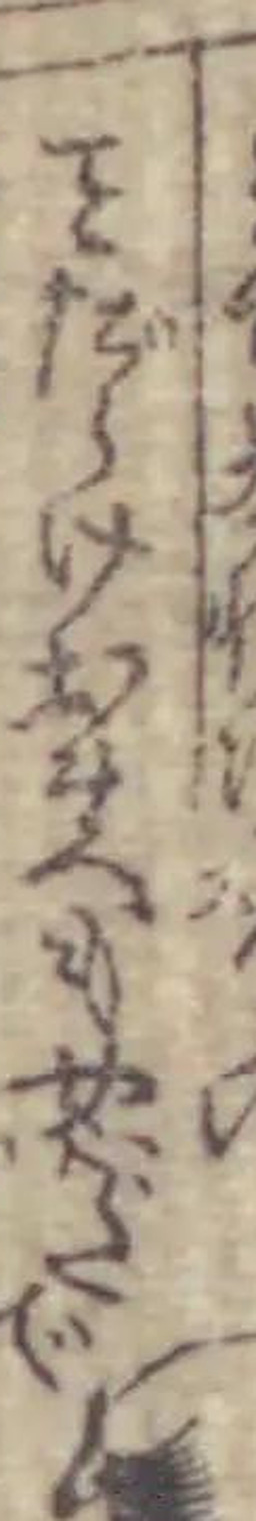ことだらけおまへも女がたで
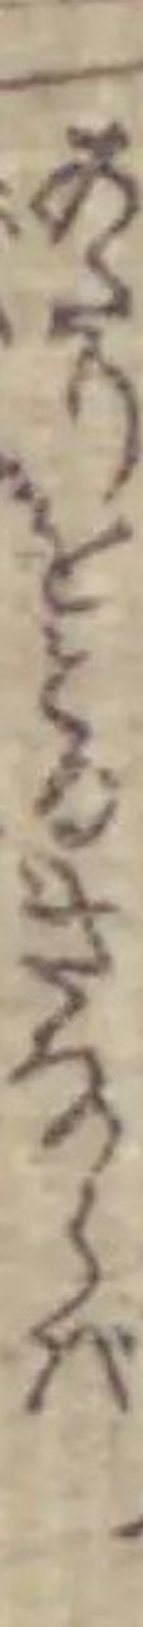あたりをとるきならば
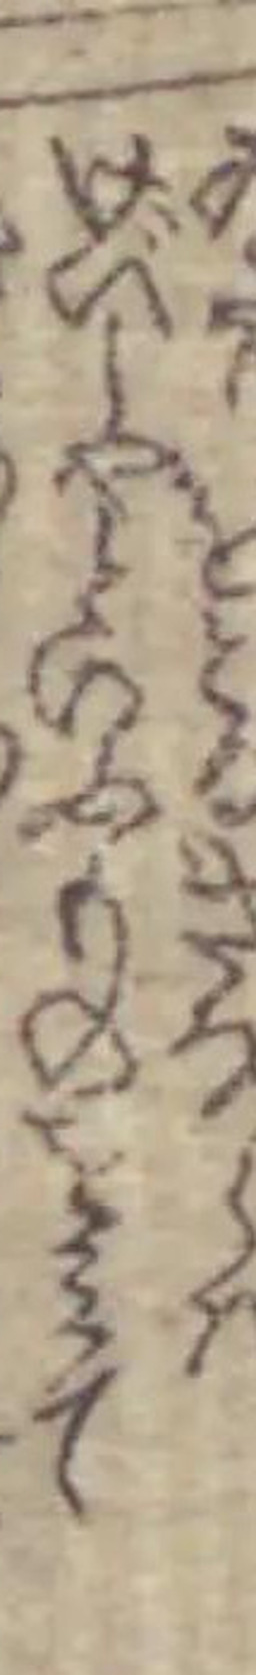げいしやといふものをみて
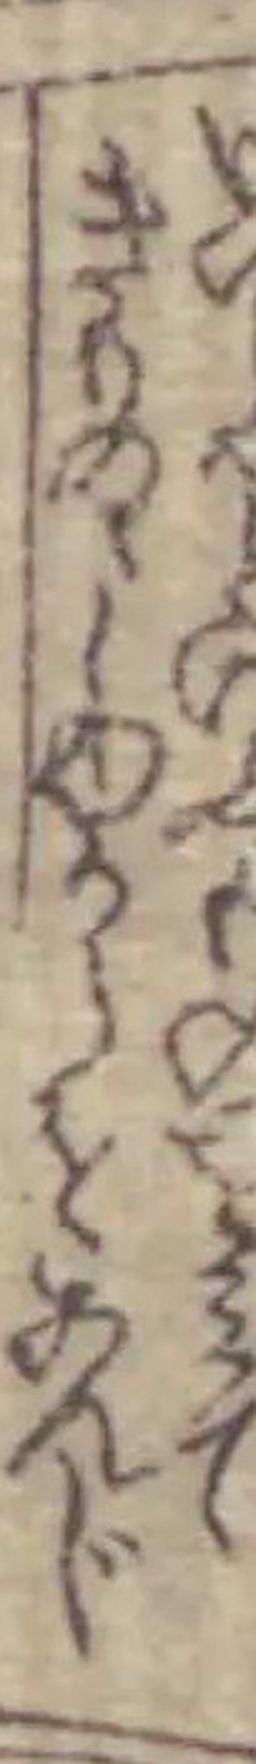きものゝしゆかうをあんじ
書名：化物昼寝鼾 2巻
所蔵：国立国会図書館 National Diet Library, JAPAN
